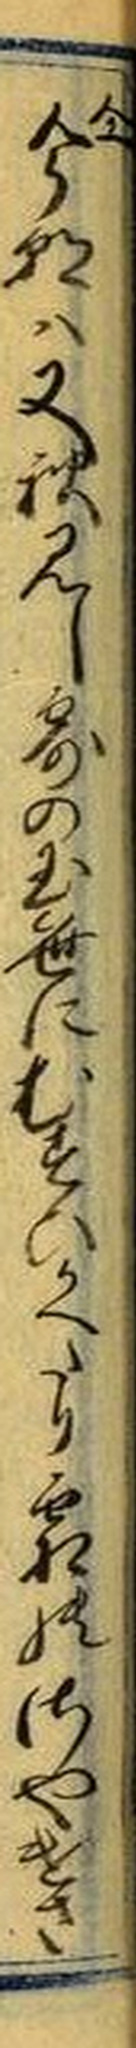今朝は又秋見し露の玉笹にむすひかへたり霜のさやけき
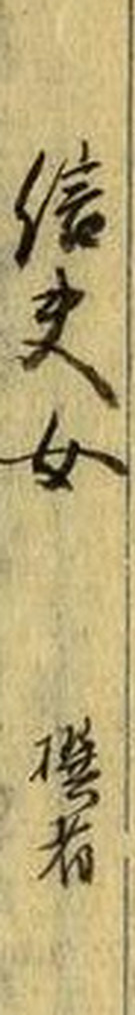信夫女撰者
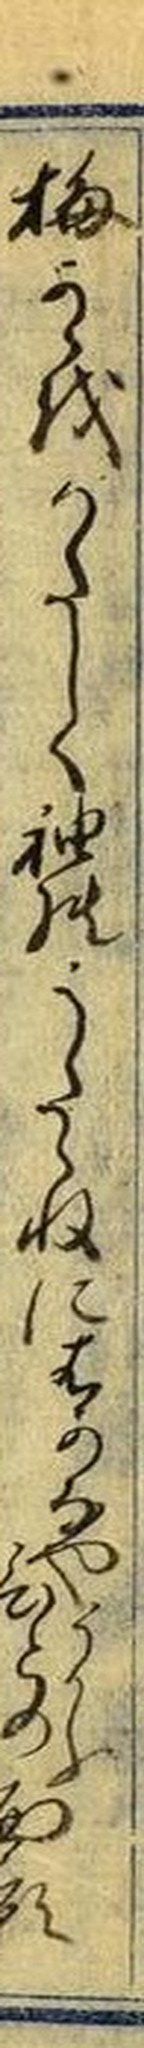梅かゝをはたしく袖のうたゝねにはかなやうかふひとの面影
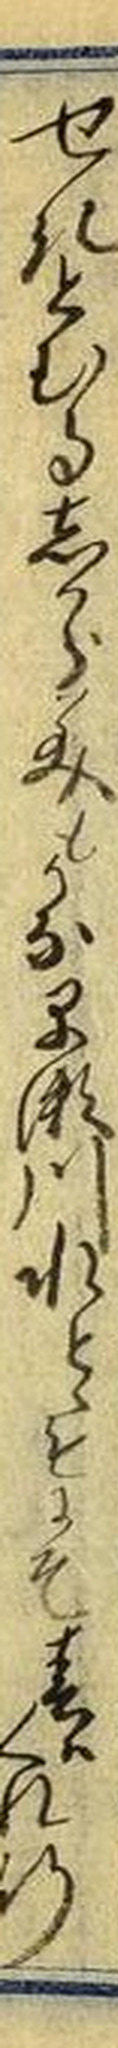せきとむるしからみもかな早瀬川水とゝもにそ春はくれ行
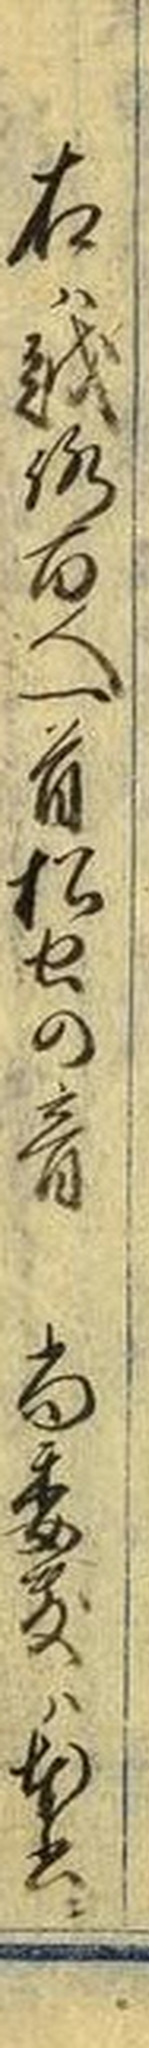右は越路百人一首松虫の音尚委敷は本書に
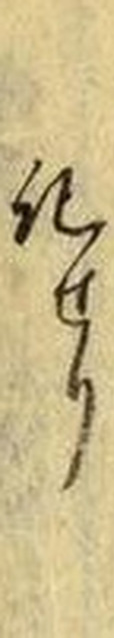記せり

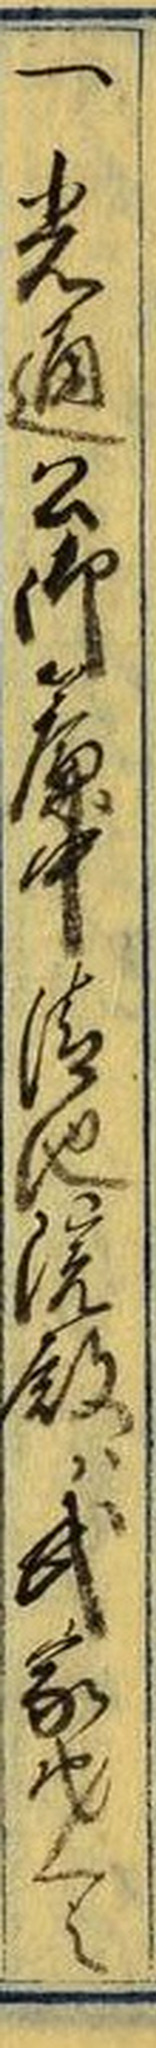一光道公御簾中清池院殿は武家第一之
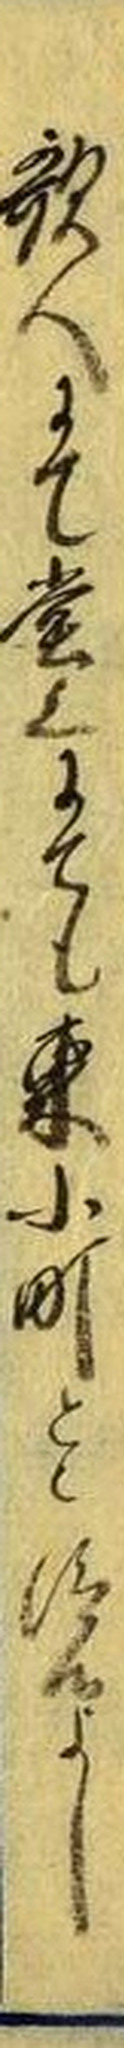歌人にて堂上にても東小町と被仰候よし
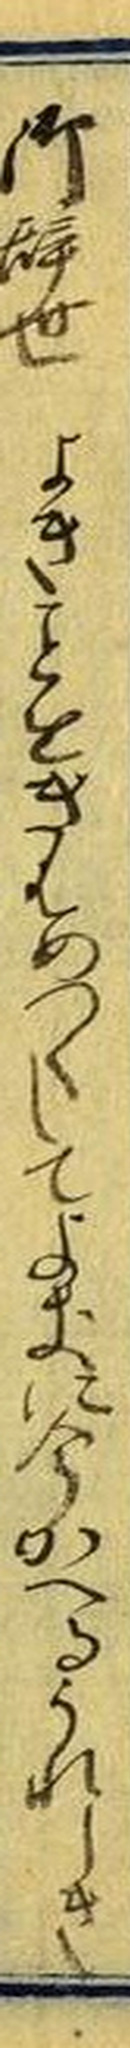御辞世よきことをきはめつくしてよきに今かへるうれしき
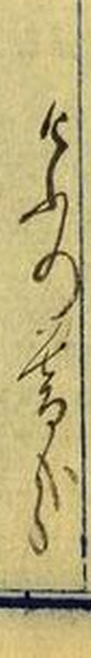けふの暮哉
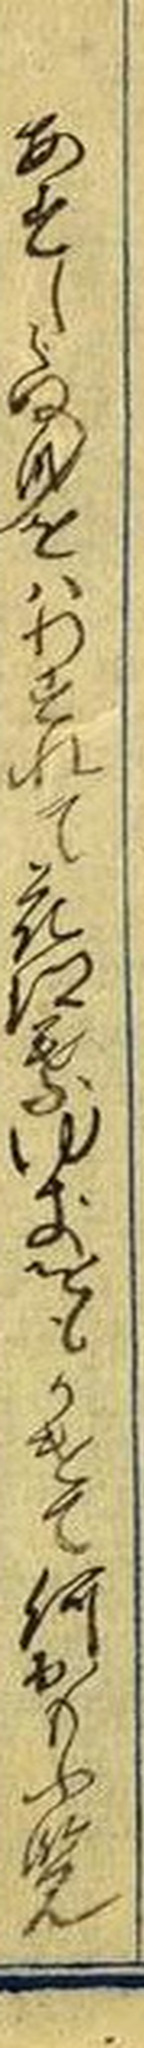あすしらぬ身をはわすれて花紅葉ゆきをもかけて何おも
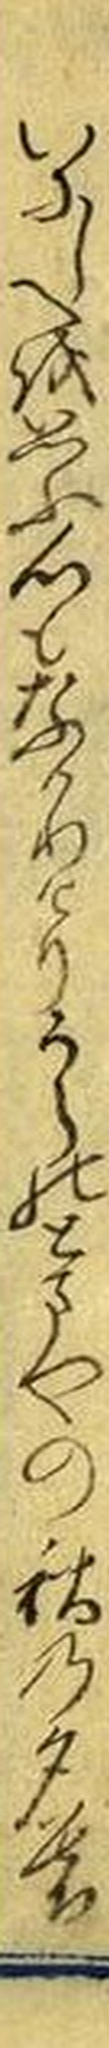いにしへを思ふ心もなかりけりうしのとまやの秋の夕暮
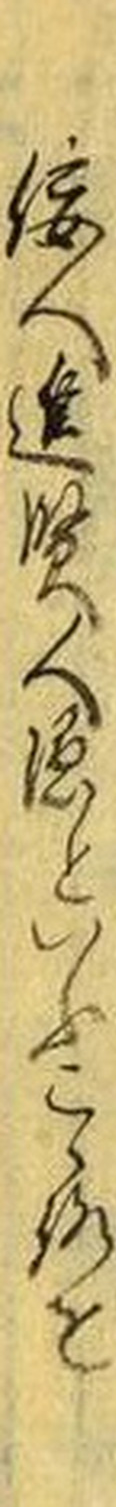倭人進賢人隠といふこゝろを

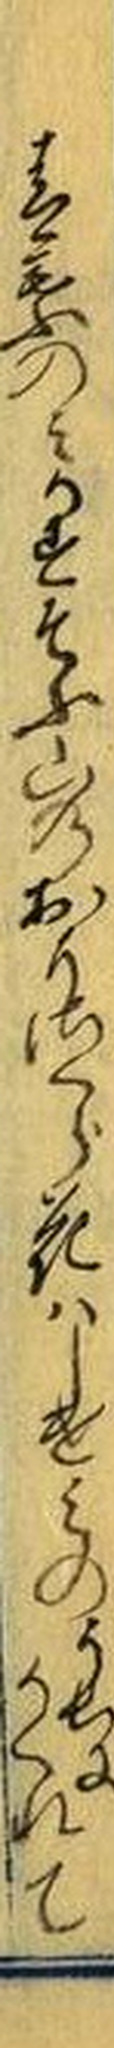青葉のみかすそふ山のおりさくら花はしけみのうちに
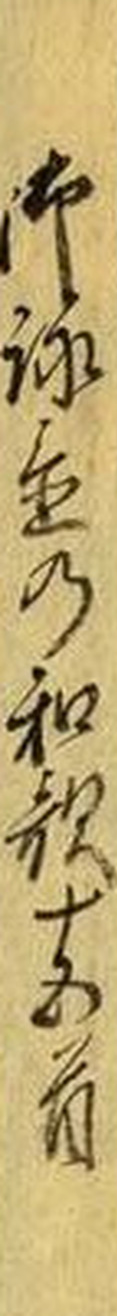御詠置の和歌十五首
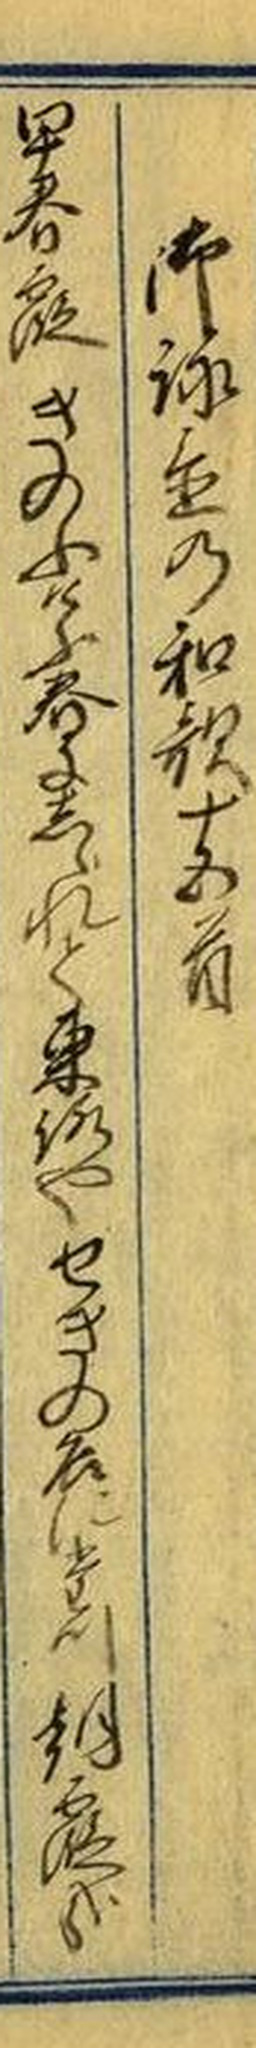きのふけふ春にしられて東路やせきの名にたつ朝霞哉
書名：温古集 三巻
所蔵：福井県文書館 Fukui Prefectural Archives
